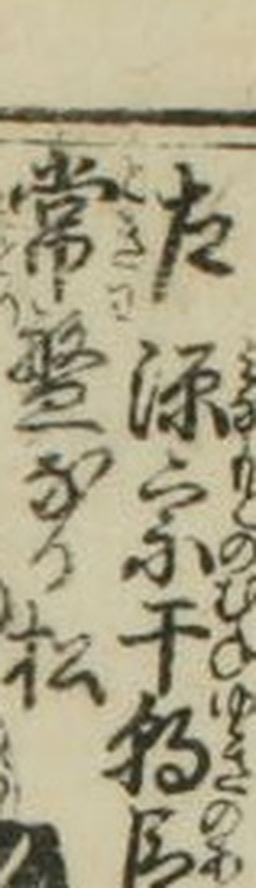常盤なる松
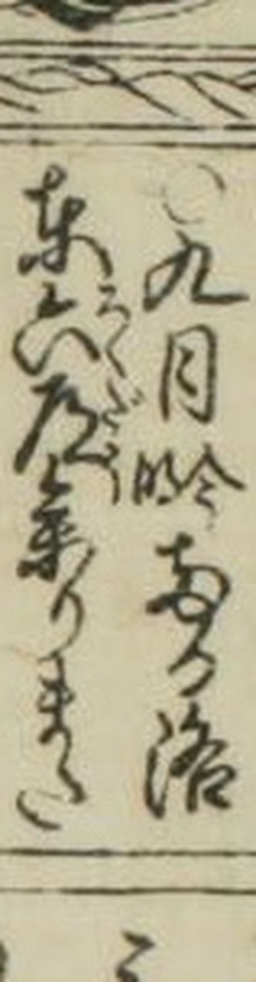東六道参りまた
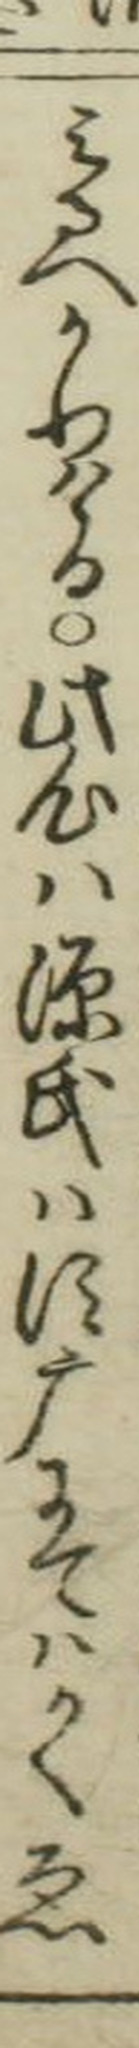みるへかりける○此心は源氏は須磨にてはかくゑ
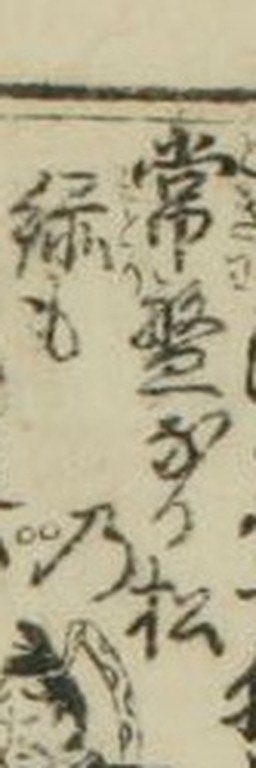緑もの
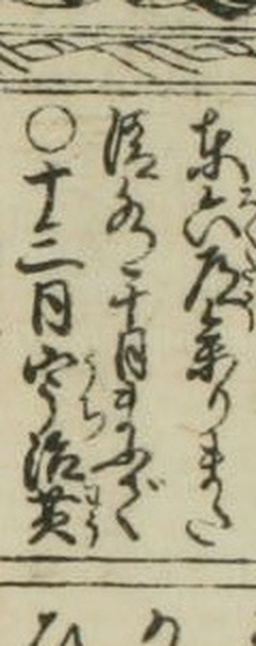清水千日まふで
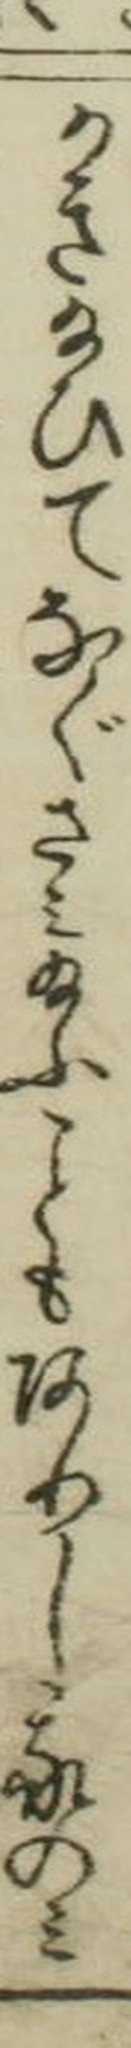かき給ひてなぐさみ給ふこともありし我のみ
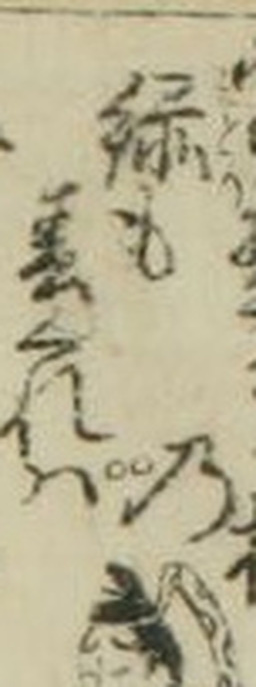春くれば
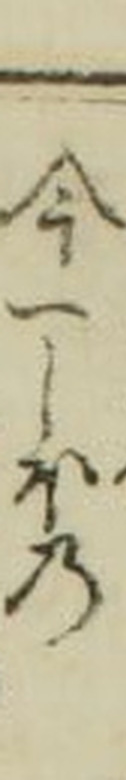今一しほの
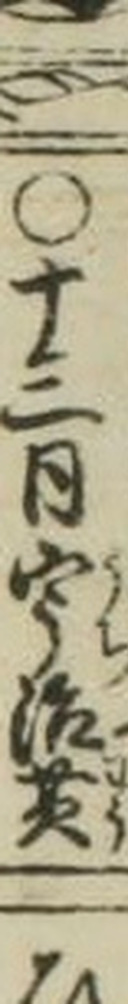○十三日宇治黄
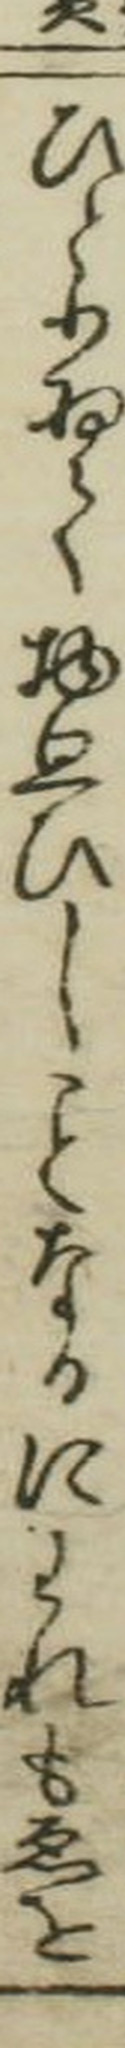ひとりゐて物思ひしことなるにわれもゑを
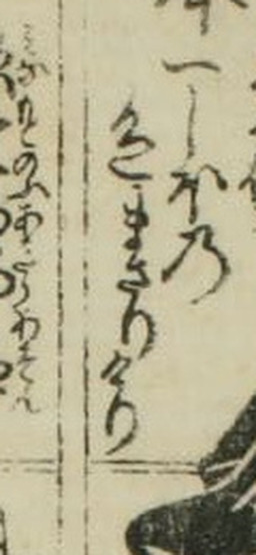色まさりけり
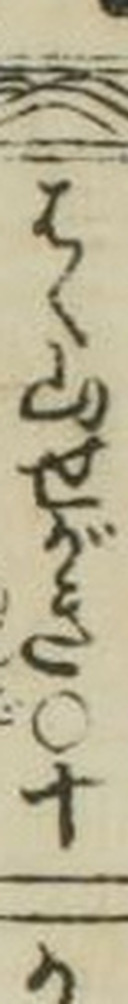はく山せがき○十
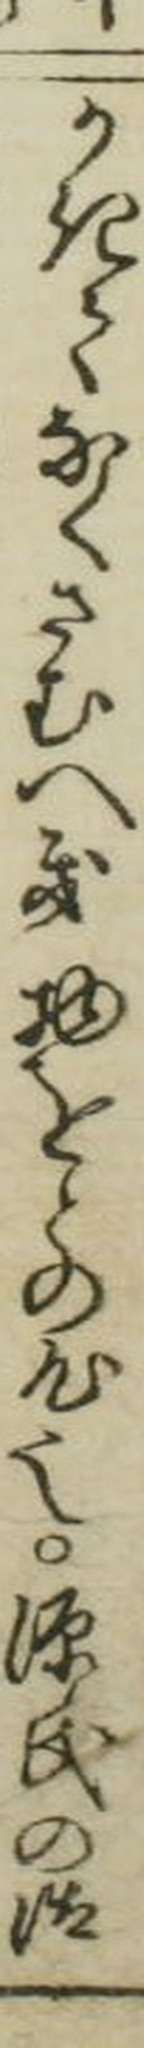かきてなくさむへき物をとの心也○源氏の御
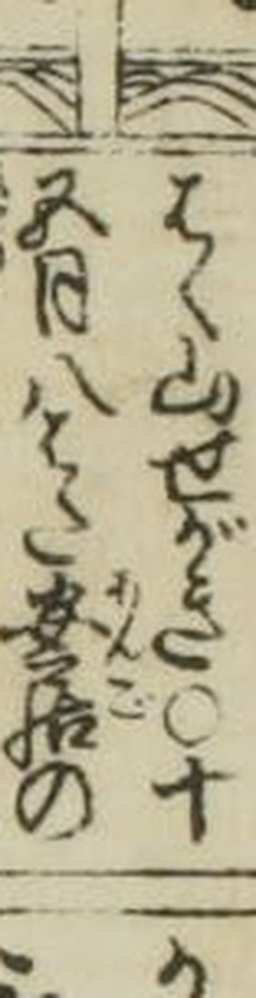五日八はた安居の
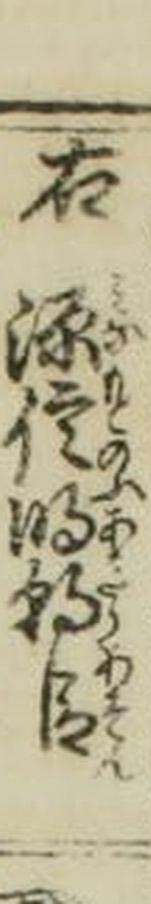右源信明朝臣
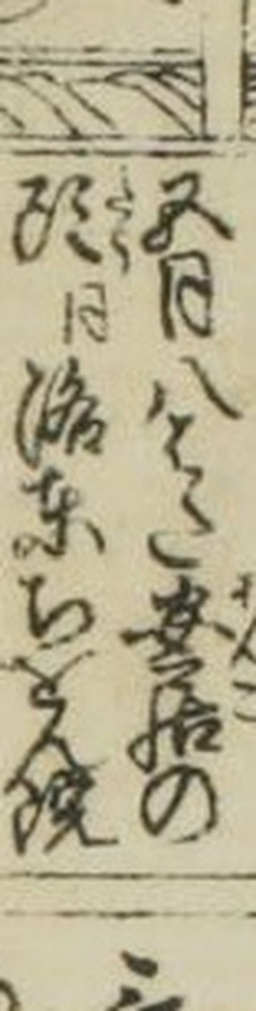頭同洛東ちをん院
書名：女源氏教訓鑑
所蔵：東京学芸大学附属図書館
